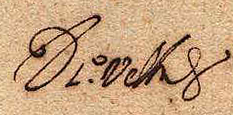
Di.o velho
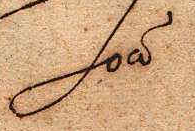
Joaõ
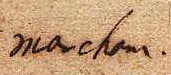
marcham.
